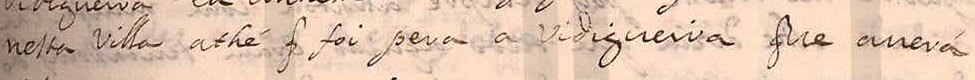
nesta Villa athé q̄ foi pera a Vidigueira que auerá
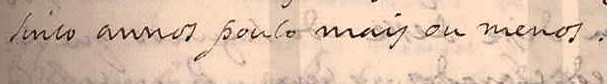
sinco annos pouco mais ou menos.
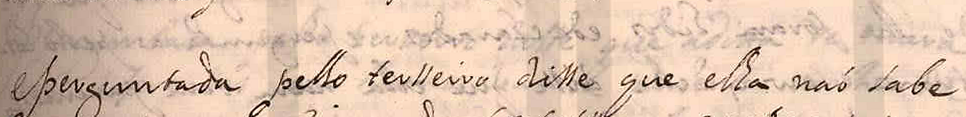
e perguntada pello tersseiro disse que ella naõ sabe
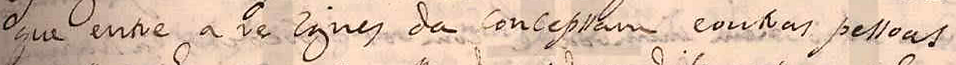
que entre a re Ignes da concepssam e outras pessoas
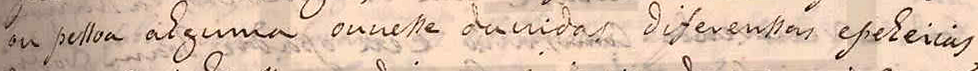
ou pessoa alguma ouuesse duuidas diferenssas e peleicas
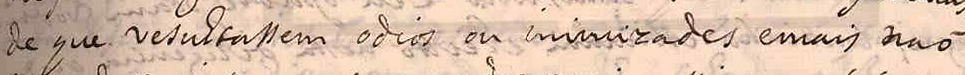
de que resultassem odios ou inimizades e mais naõ
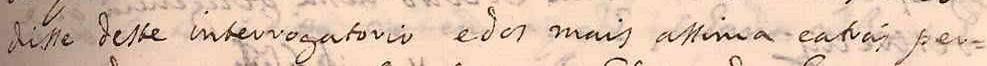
disse desse interrogatorio e dos mais assima e atras per
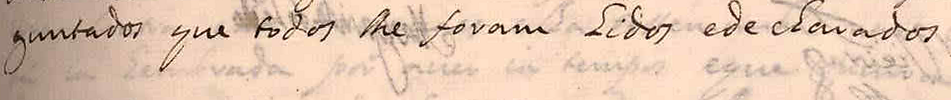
guntados que todos lhe foram Lidos e declarados
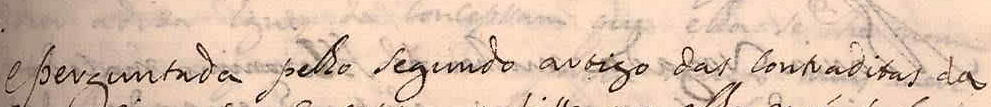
e perguntada pello segundo artigo das contraditas da
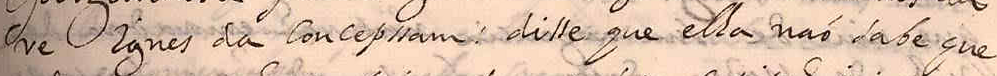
re Ignes da Concepssam, disse que ella naõ sabe que
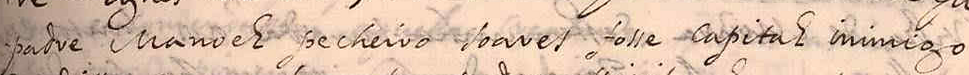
padre Manoel pecheiro soares fosse capital inimigo
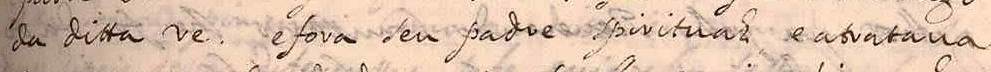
da ditta re. e fora seu padre spiritual e a trataua
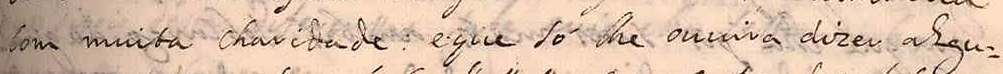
com muita charidade; e que só lhe ouuira dizer algu
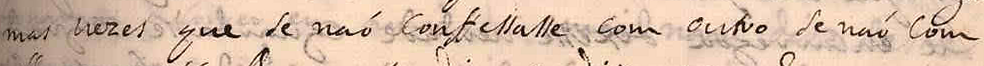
mas uezes que se naõ confessasse com outro senaõ com
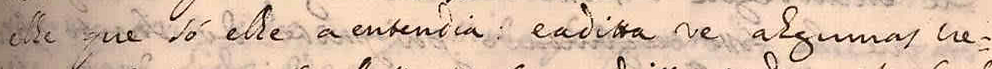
elle que só elle a entendia; e a ditta re algumas ue
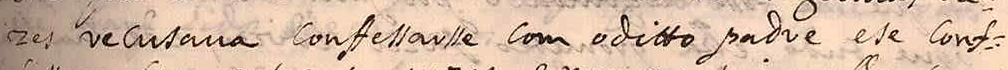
zes recusaua confessarsse com o ditto padre e se conf
